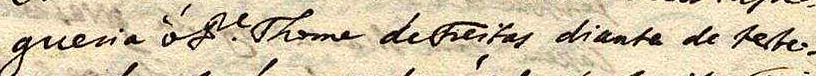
guezia o P.e Thome de Freitas diante de teste
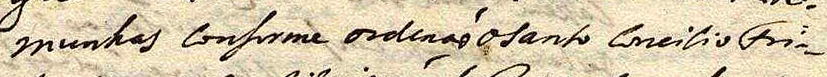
munhas conforme ordenaõ o santo Concilio Tri
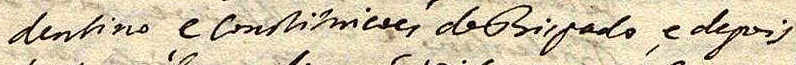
dentino, e constituiçoẽs do Bispado, e depois
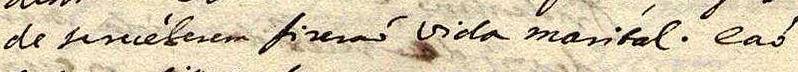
de se receberem fizeraõ vida marital. e ao
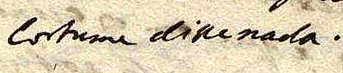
costume disse nada.
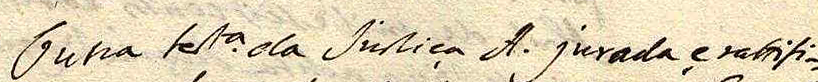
Outra testa. da Iustiça A. jurada, e ratifi
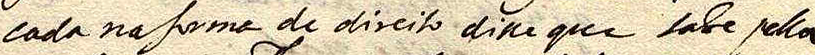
cada na forma de direito disse que sabe pella
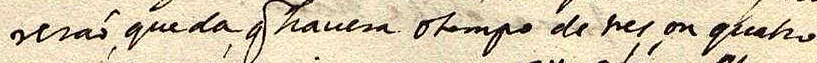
rezaõ, que da, q̄ hauera o tempo de tres, ou quatro
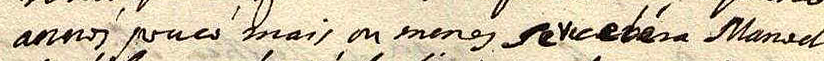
annos pouco mais, ou menos se recebera Manoel
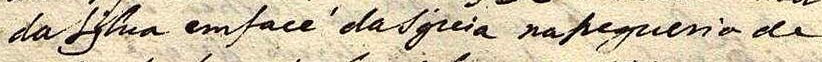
da Sjlua em face da Igreia na freguezia de
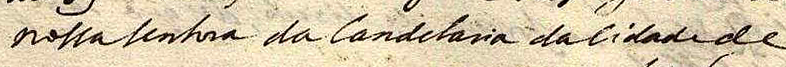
nossa senhora da Candelaria da cidade de
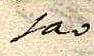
saõ
